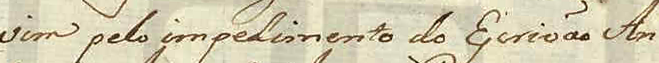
vim pelo impedimento do Escrivaõ An
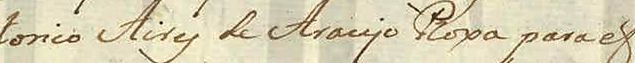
tonio Aires de Araujo Roxa para ef
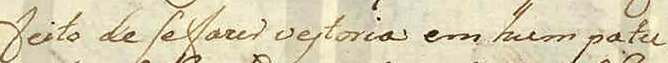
feito de se fazer vestoria em hum patu
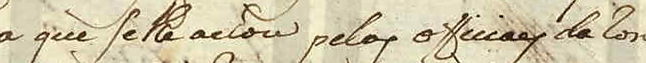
a que se lhe achou pelos officiaes da Ron
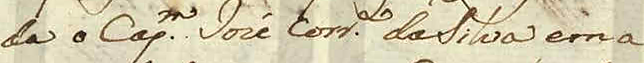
da o Cap.m Iozé Corr.a da Silva em a
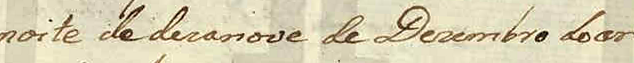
noite de dezanove de Dezembro do an
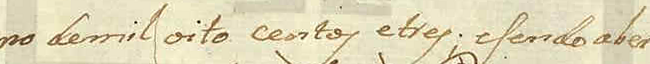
no de mil oitocentos e tres; e sendo aber
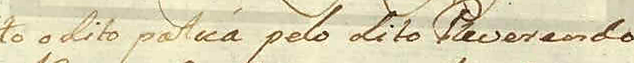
to o dito patuá pelo dito Reverendo
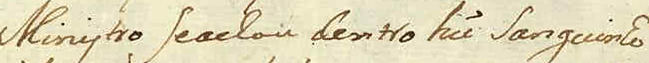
Ministro se achou dentro hū Sanguinho
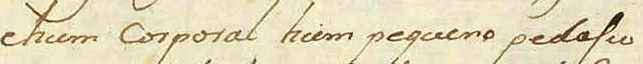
e hum corporal hum pequeno pedasso
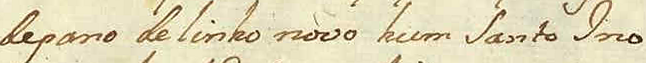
de pano de linho novo hum Santo Ino
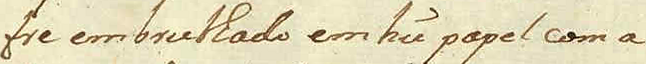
fre embrulhado em hū papel com a
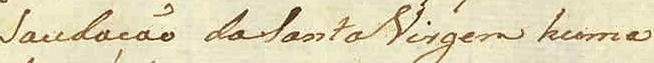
Saudaçaõ da Santa Virgem huma
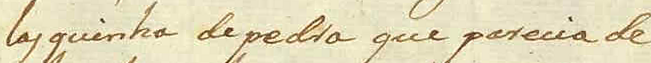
lasquinha de pedra que parecia de
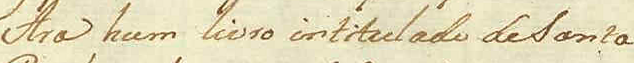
Ara hum livro intitulado de Santa
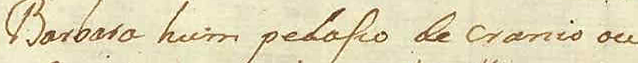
Barbara hum pedasso de cranio ou
